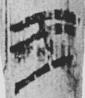王
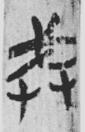戒
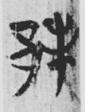邦
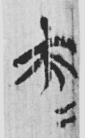大夫
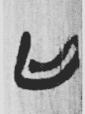㠯
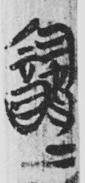飲酒
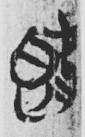既
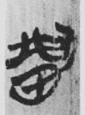{刑田}（刑）
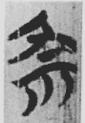{夊示}（落）
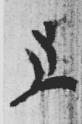之
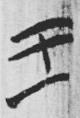王
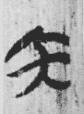內（入）
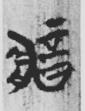𨟻（將）
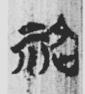{示各}（落）
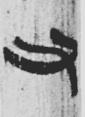又（有）
